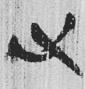又（有）
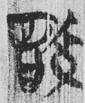○（絞）
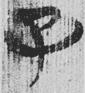子
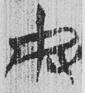奴（如）
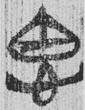思
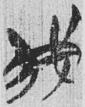我
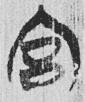宮
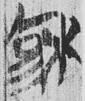穆
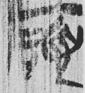碩
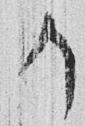人
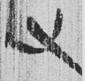又（有）
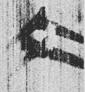文
